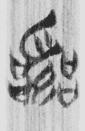亂
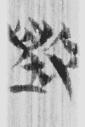毀
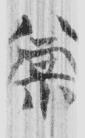常
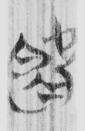既
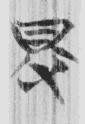𠭁
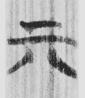亓
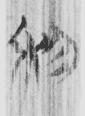利
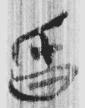昏
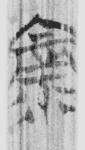{宀彔}
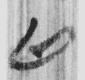㠯（以）
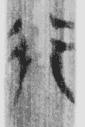行
